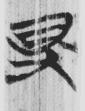𠭁
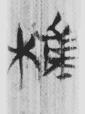{木甫}
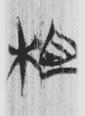相
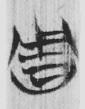周
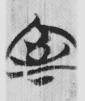室
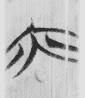亦
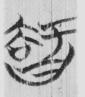智
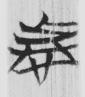者
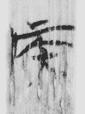侯
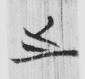之
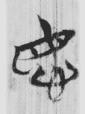悔
